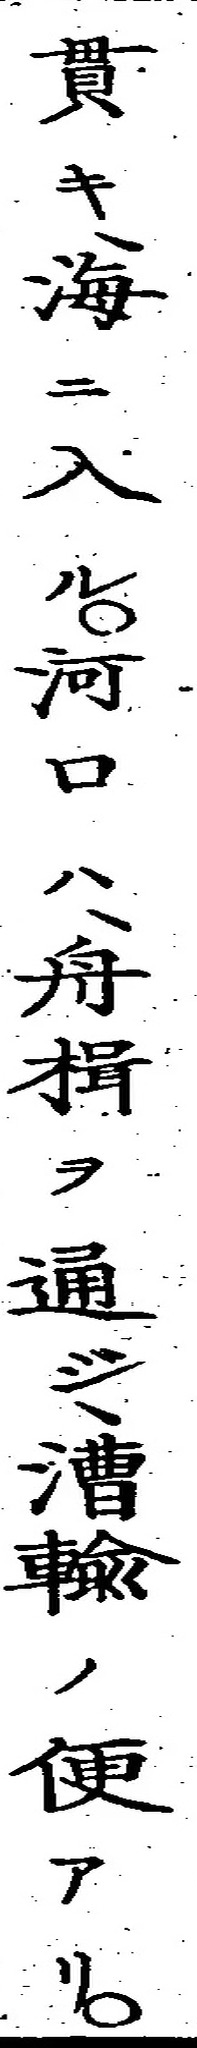貫キ、海ニ入ル。河口ハ、舟楫ヲ通ジ、漕輸ノ便アリ。
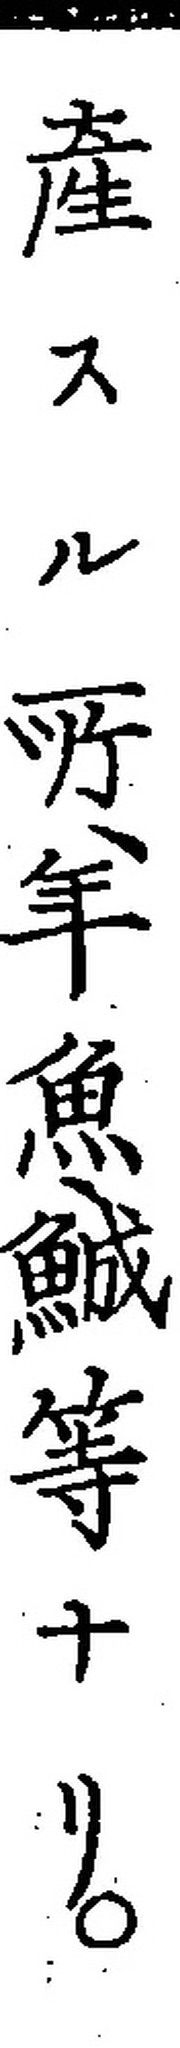産スル所、年魚・鯎等ナリ。
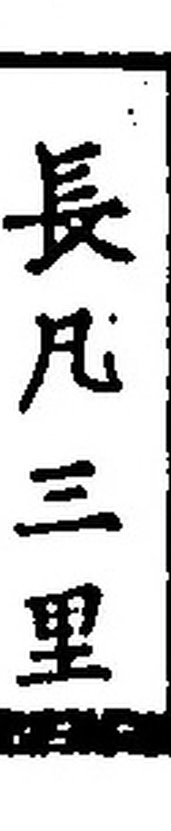長凡三里
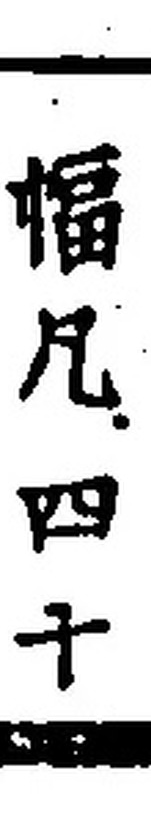幅凡四十

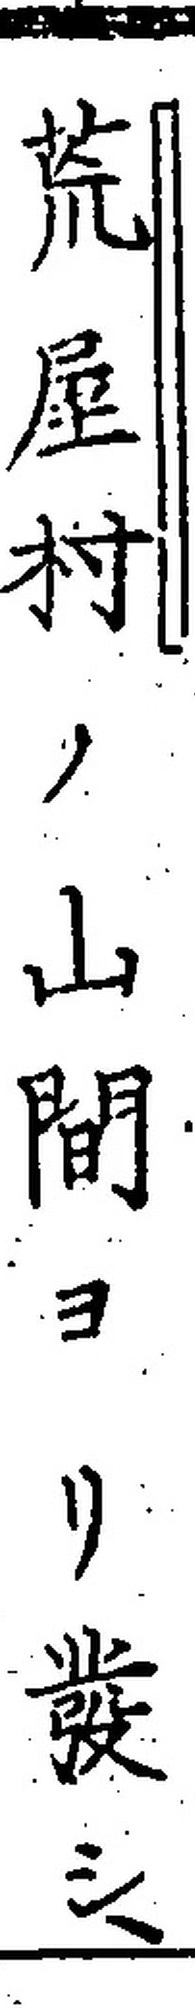荒屋村ノ山間ヨリ発シ、
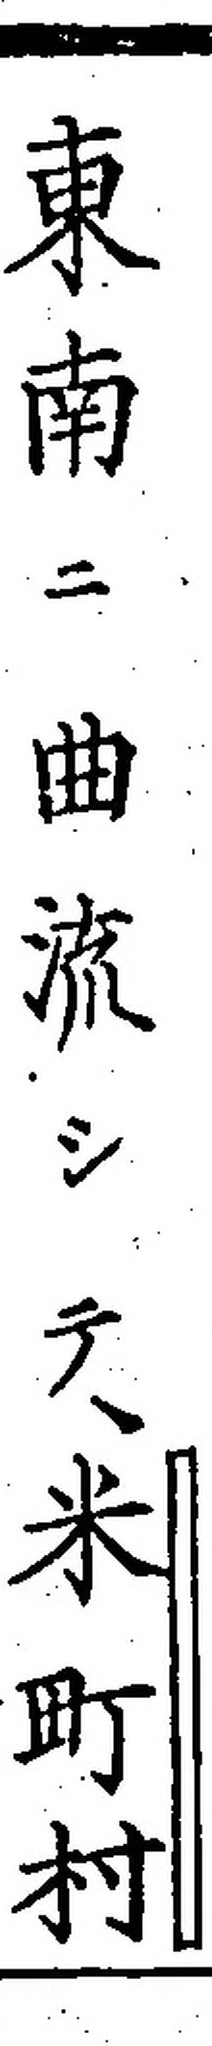東南ニ曲流シテ、米町村
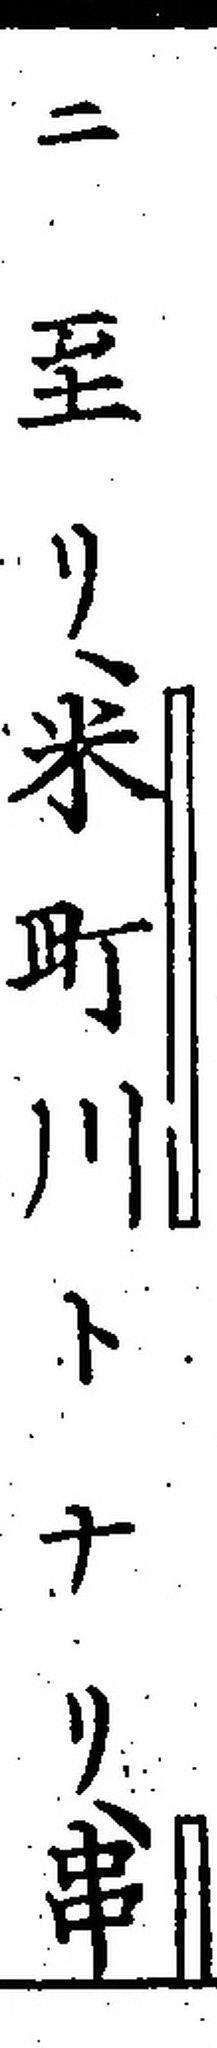ニ至リ、米町川トナリ、串
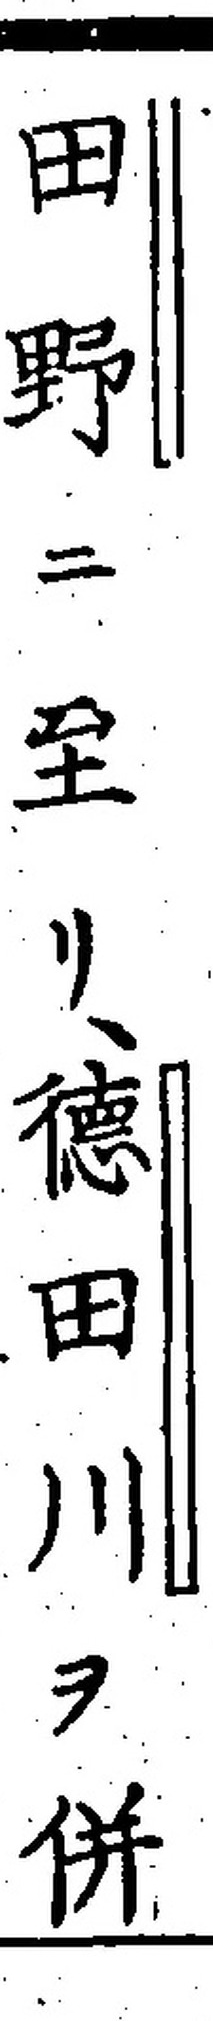田野ニ至リ、徳田川ヲ併
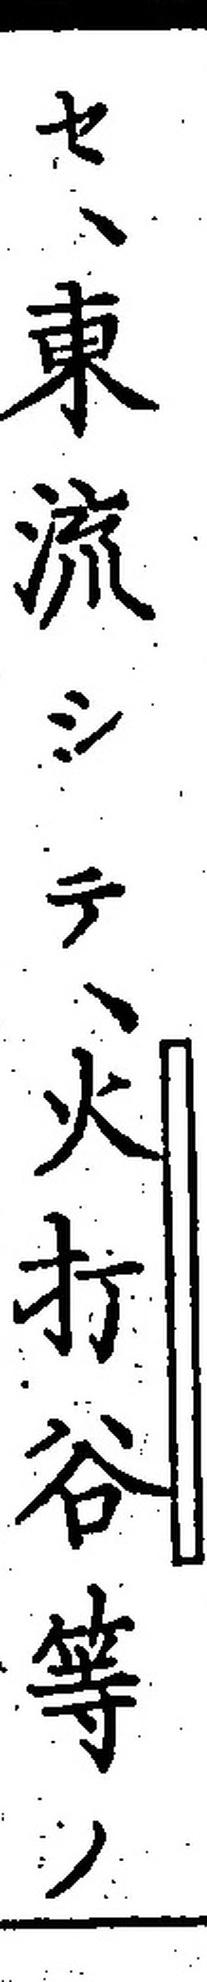セ、東流シテ、火打谷等ノ
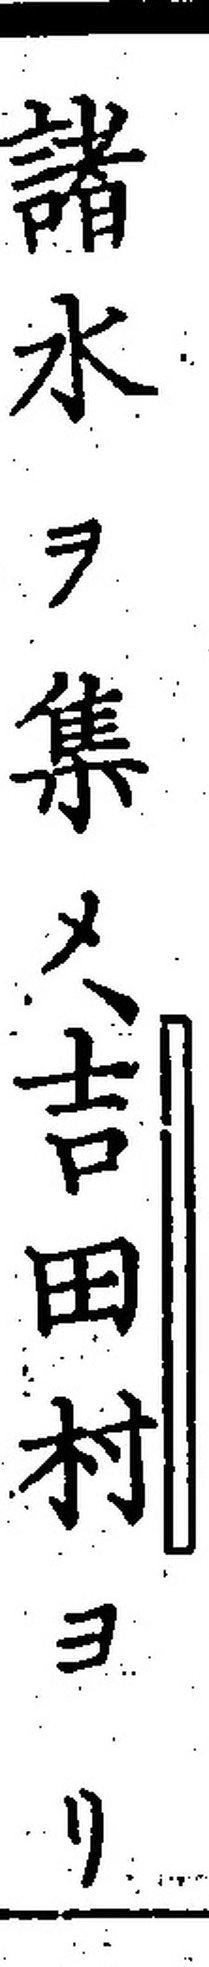諸水ヲ集メ、吉田村ヨリ
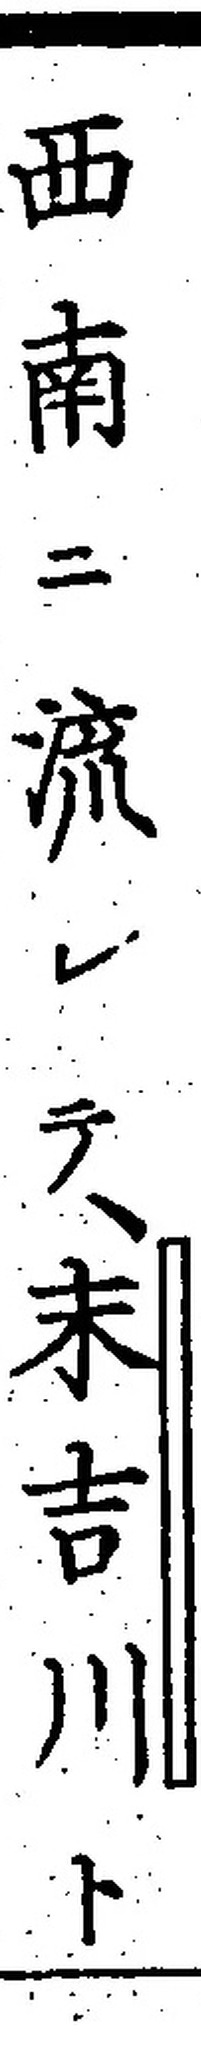西南ニ流レテ、末吉川ト
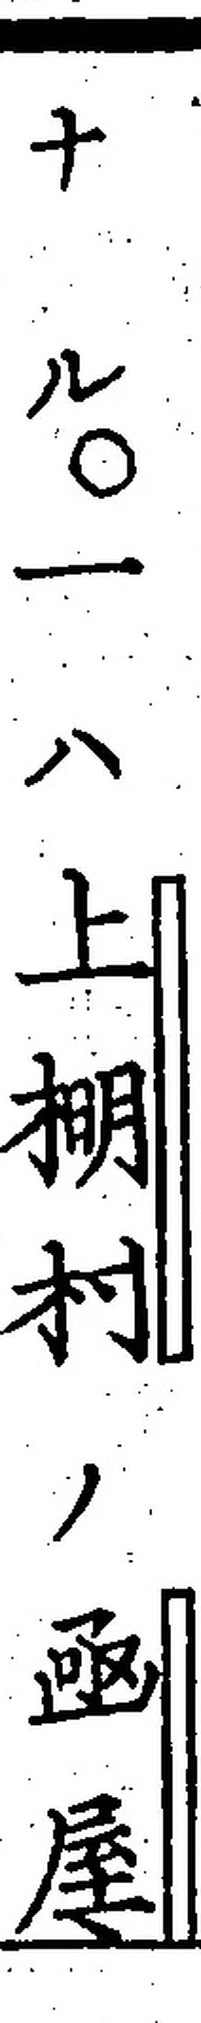ナル。一ハ上棚村ノ函屋・
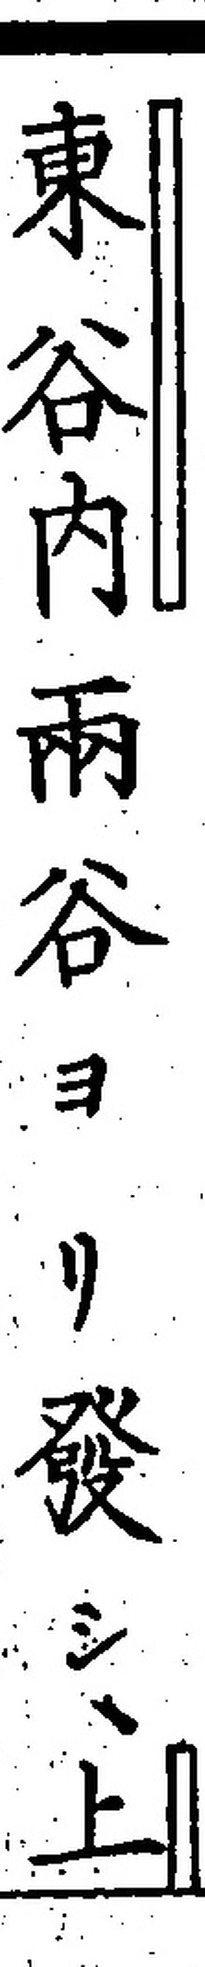東谷内両谷ヨリ発シ、上
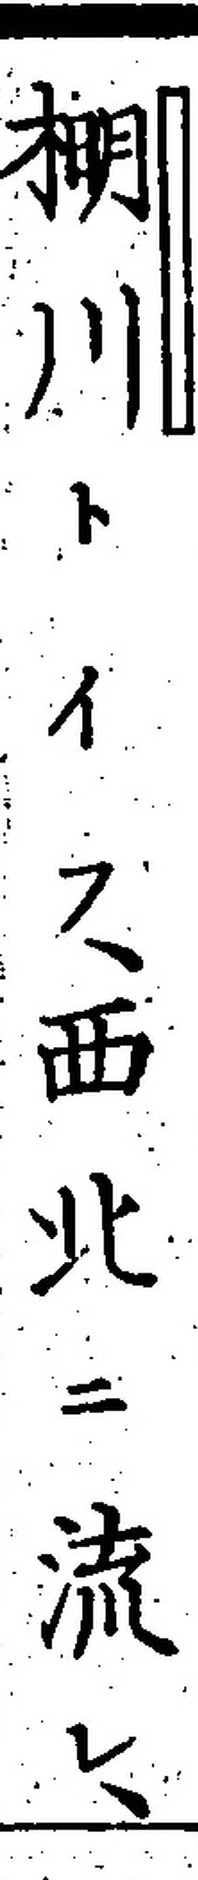棚川トイフ、西北ニ流レ、
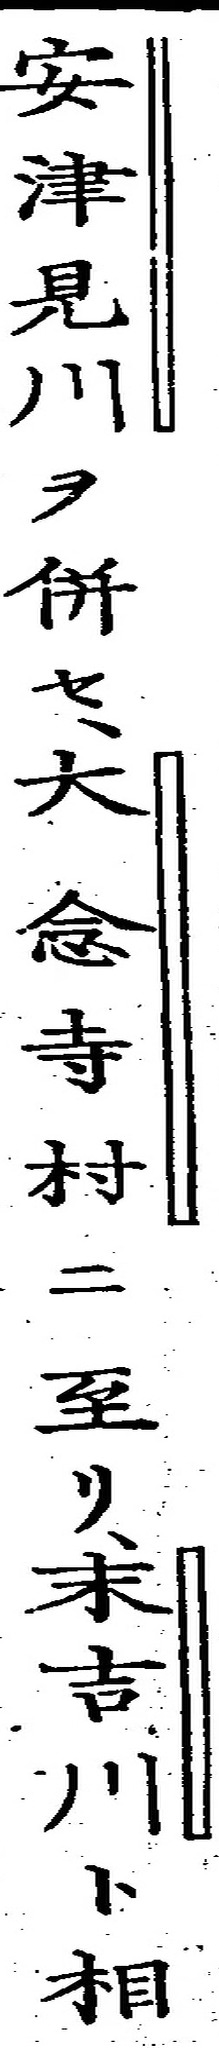安津見川ヲ併セ、大念寺村ニ至リ、末吉川ト相
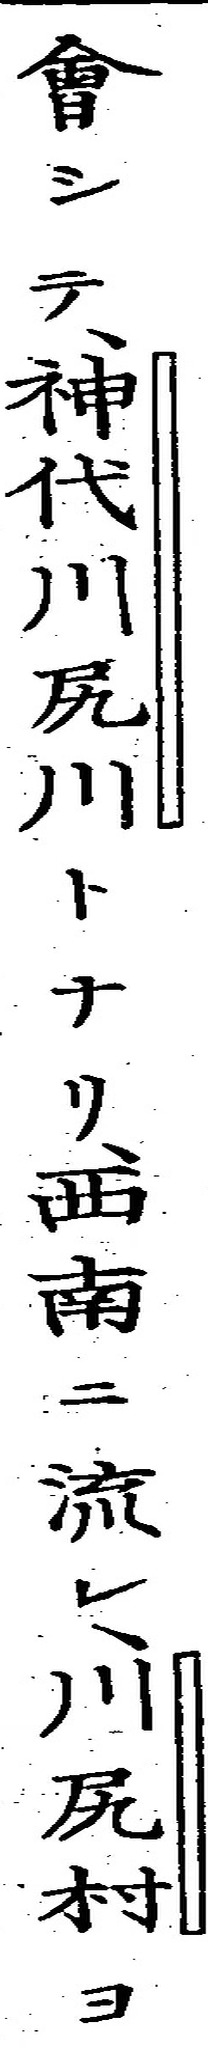会シテ、神代川尻川トナリ、西南ニ流レ、川尻村ヨ
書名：能登地誌略
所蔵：国立国会図書館 National Diet Library, JAPAN
